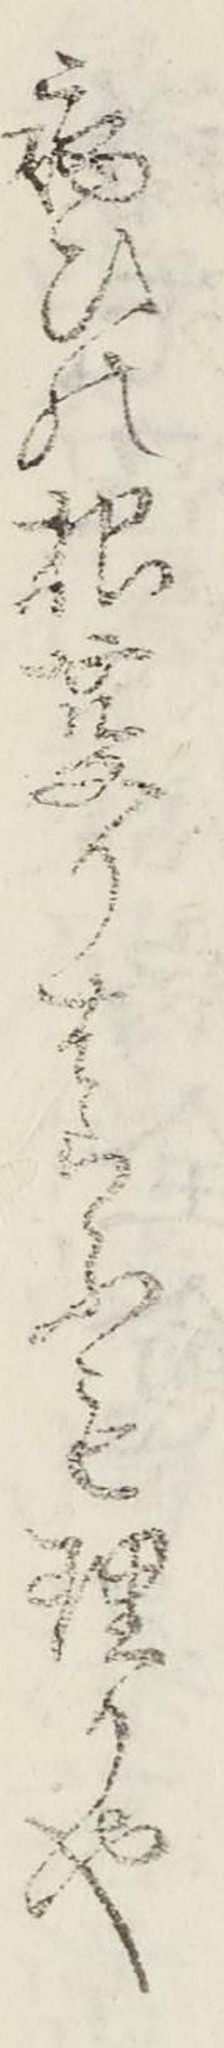病ひの根芟りはらふも理りや
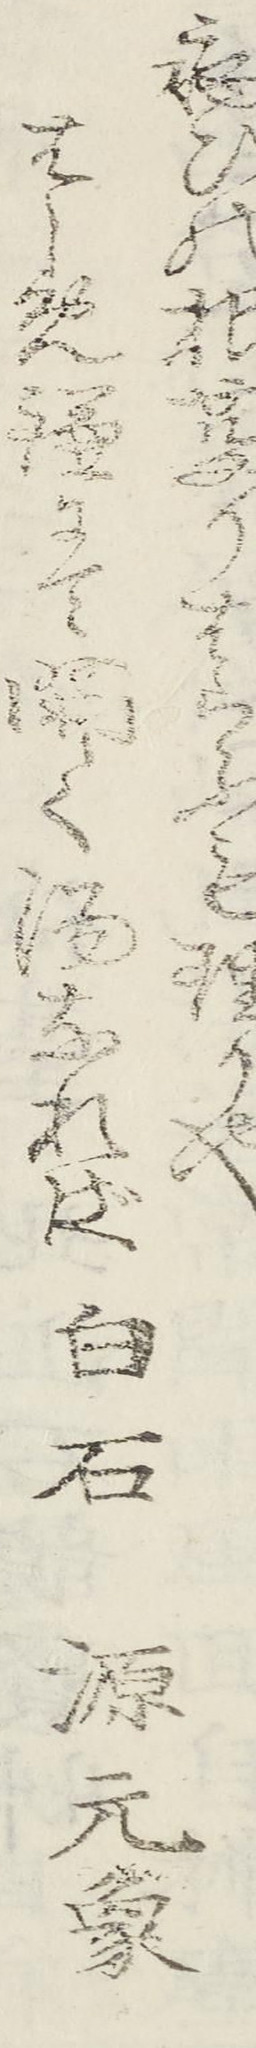はしめ鎌にて開く湯なれば白石源元象
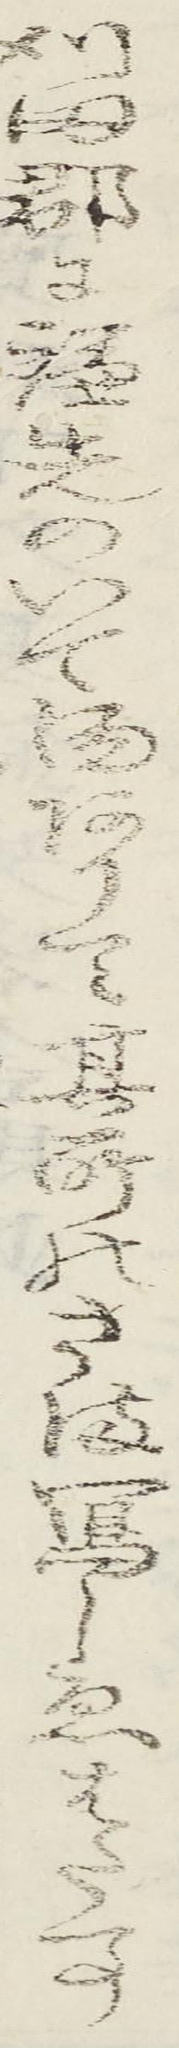刈田郡に鎌先のいて湯ありて其所のさま写しゑはたし
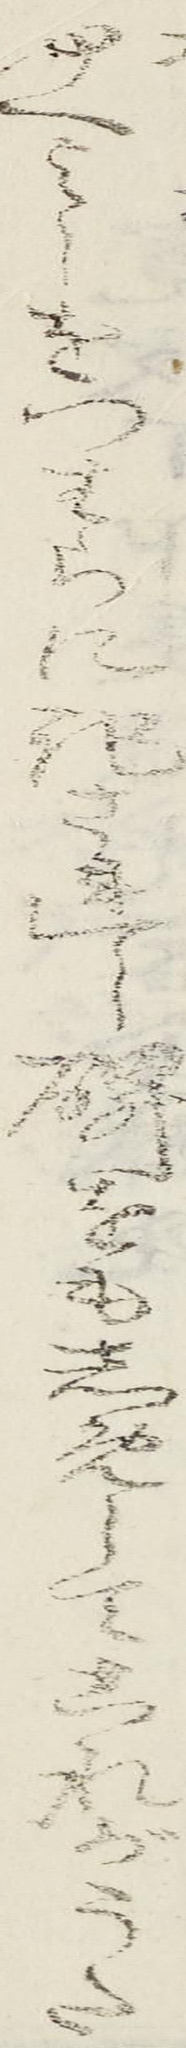ゆへよしをつむらに記されし碑をもしめしてこれがうた
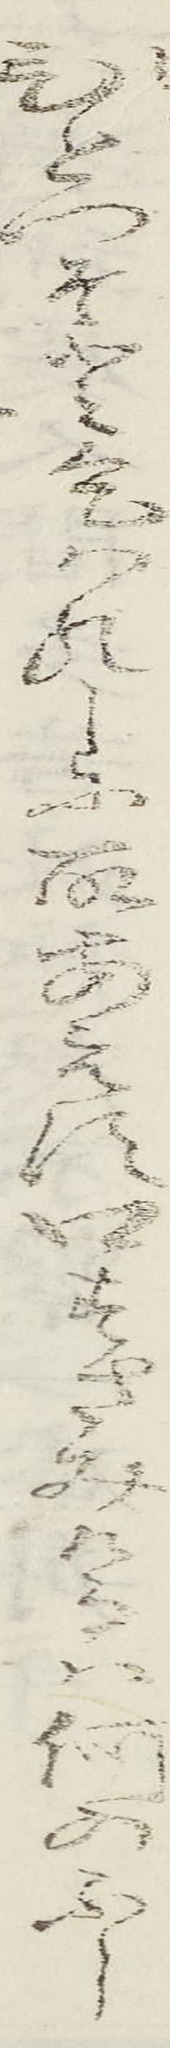ひとつそと乞はれしに取あえす口すさみけるは何のふし
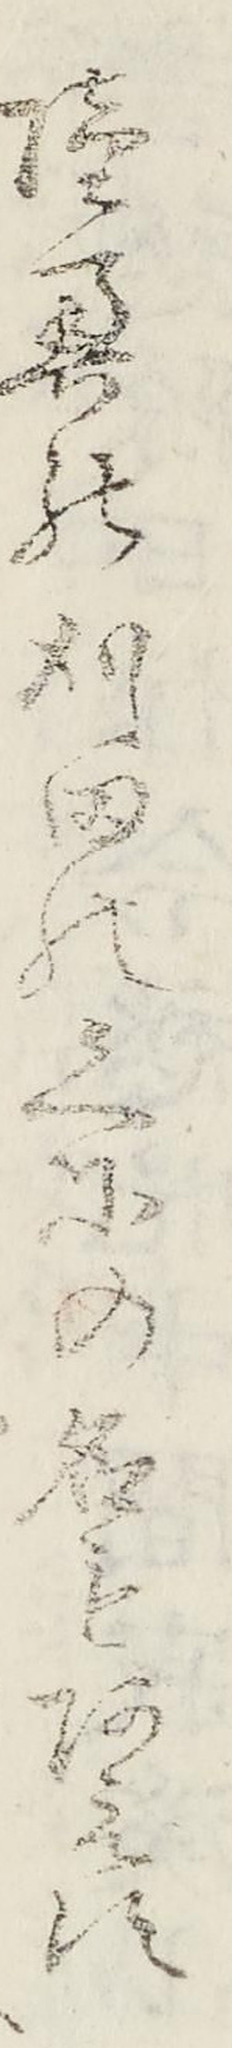陸奥の刈田のくにの名もあえす
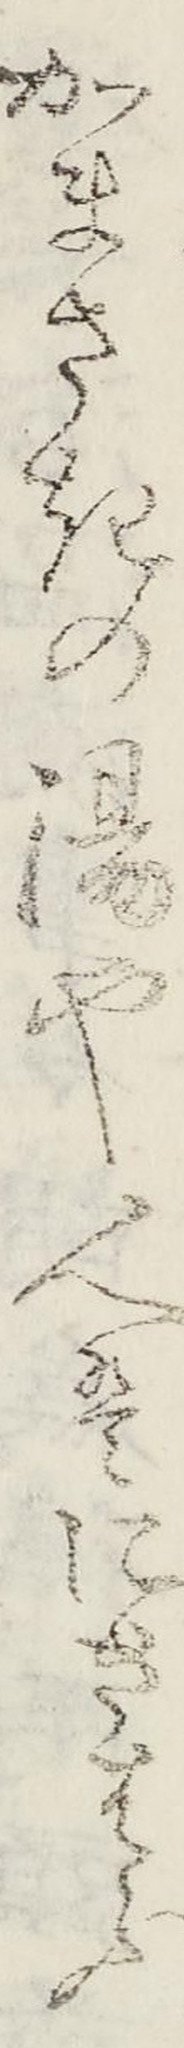かまさきの湯や人とにきはふ
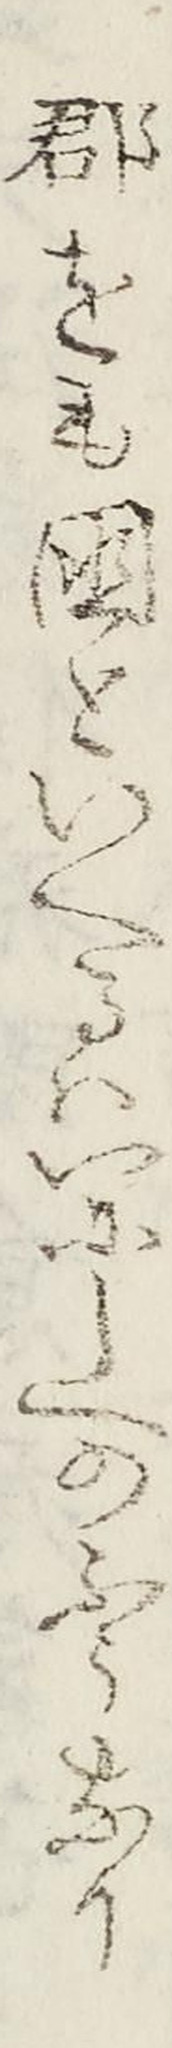郡をも国といへるはいにしへのふうなり
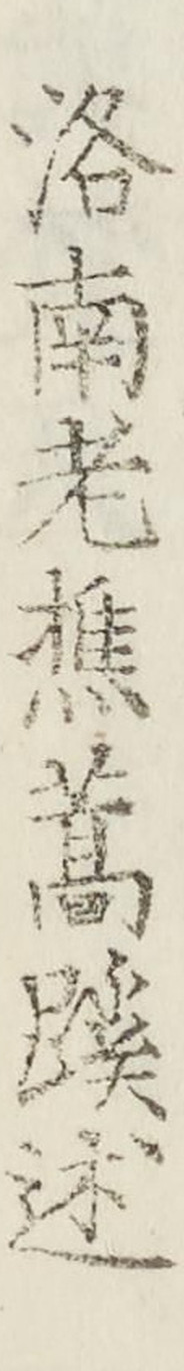洛南老樵蒿蹊述
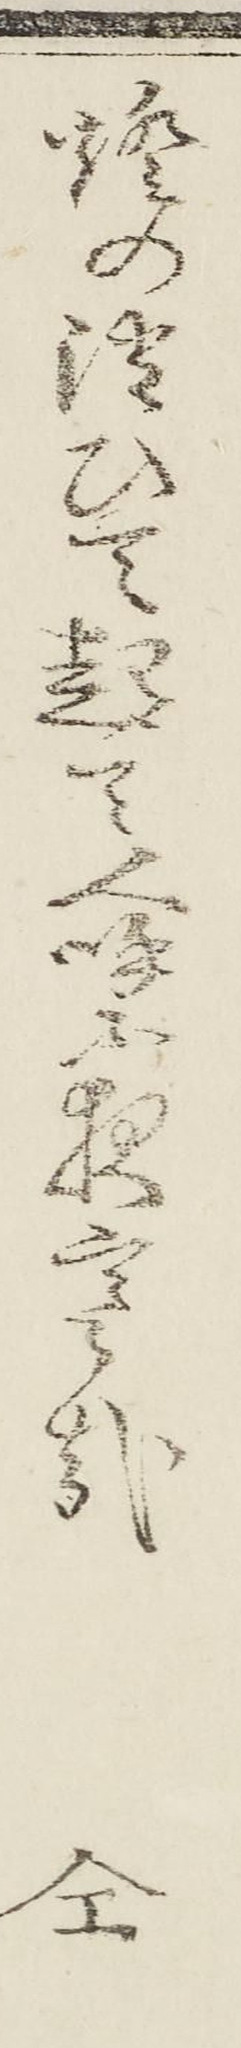燈の消ひて起て人呼ふ夜寒哉仝
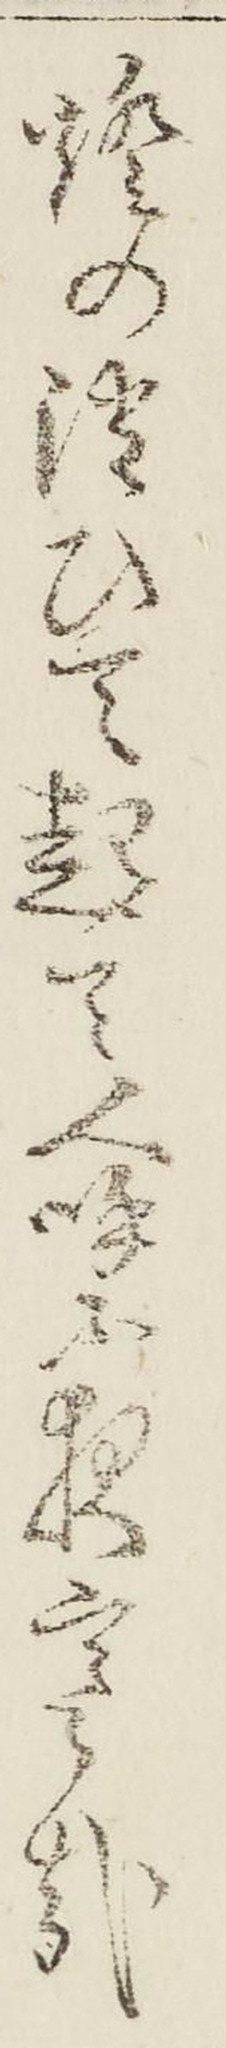燈の消ひて起て人呼ふ夜寒哉仝
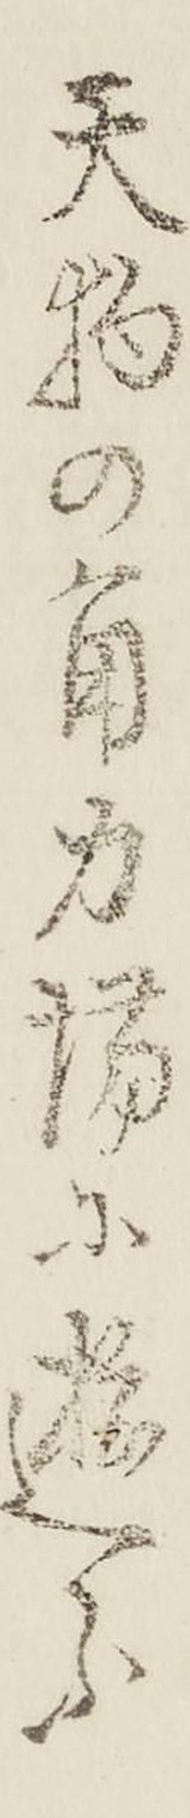天狗の角力場に遊ふ
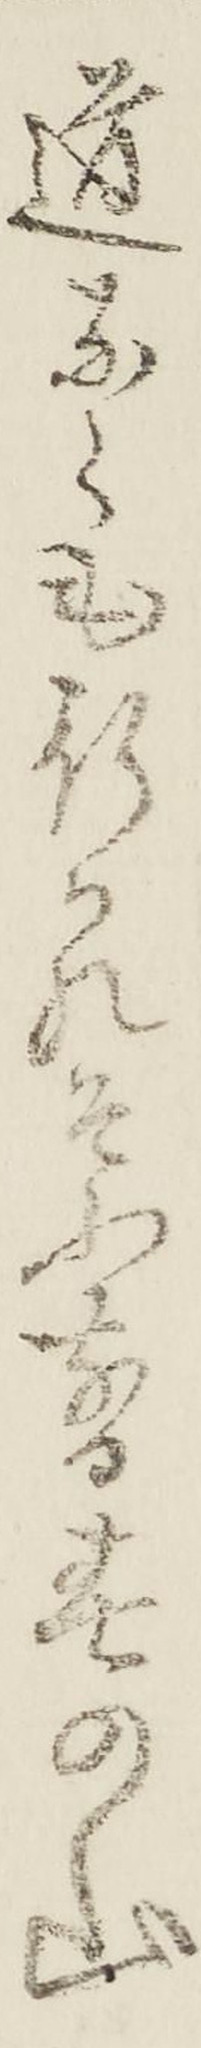道なくも行かれそふなる春の山仝
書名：鎌先温泉由來記
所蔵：東京大学地震研究所図書室 Earthquake Research Institute Library, The University of Tokyo, JAPAN
